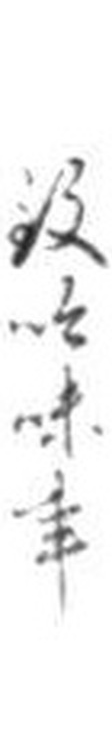致吟味事
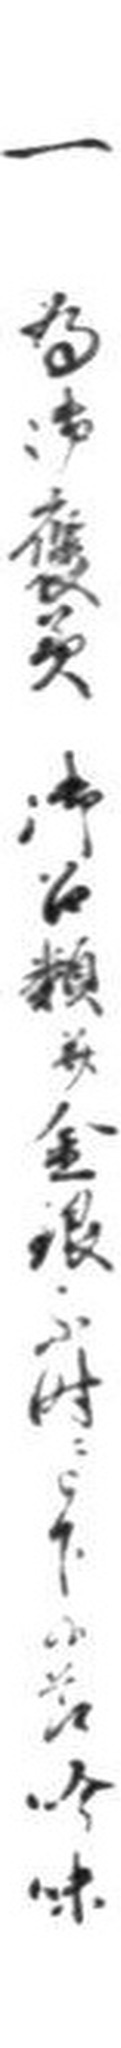一為御褒美御召類并金銀不時ニ被下候節吟味
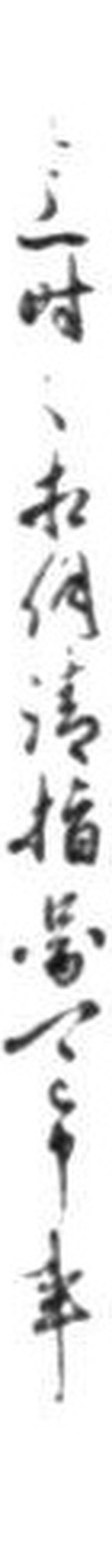之上時々相伺請指図可被申事
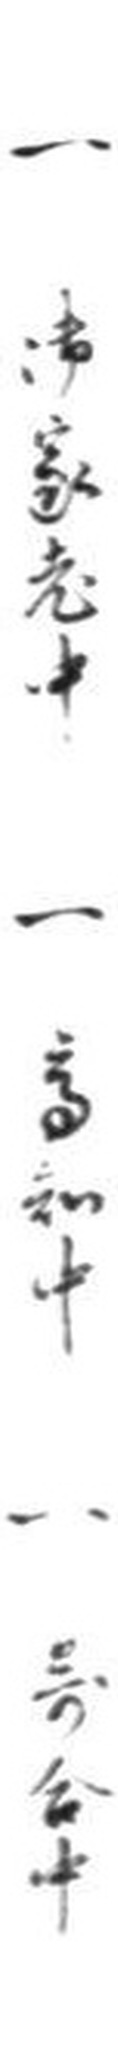一御家老中一高知中一寄合中
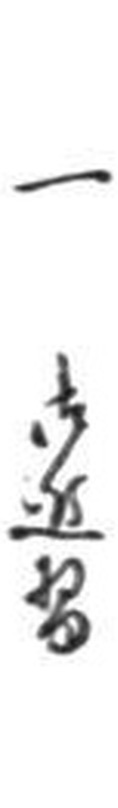一御近習
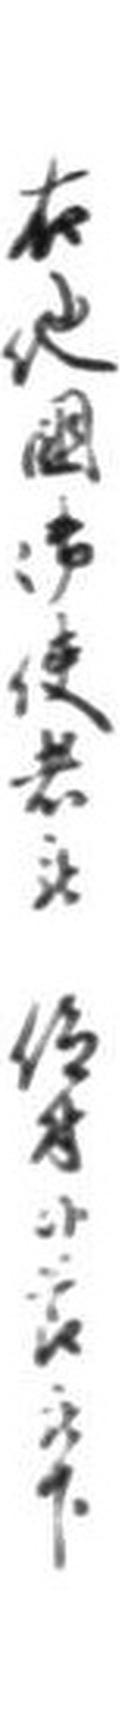右他国御使者被仰付候節被下
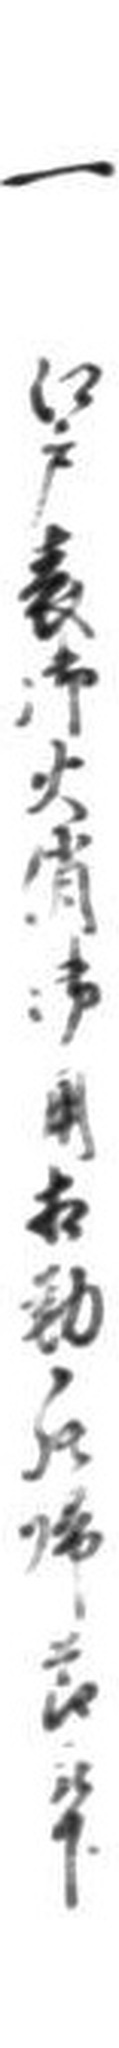一江戸表御火消御用相勤罷帰節被下
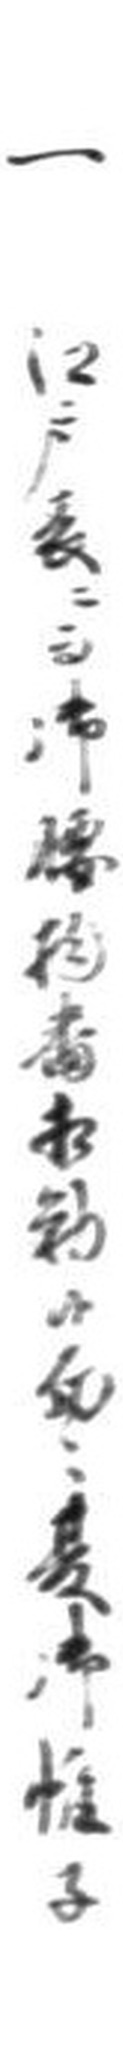一江戸表ニ而御腰物番相勤候面々夏御帷子
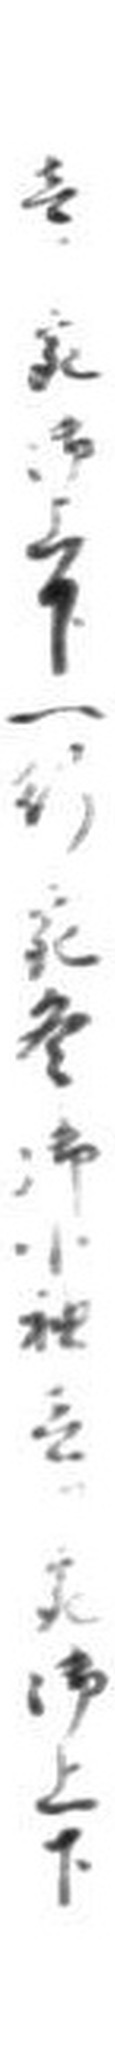壱宛御上下一行宛冬御小袖壱宛御上下
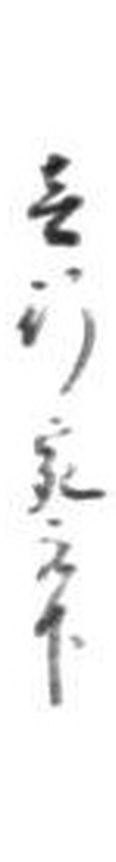壱行宛被下
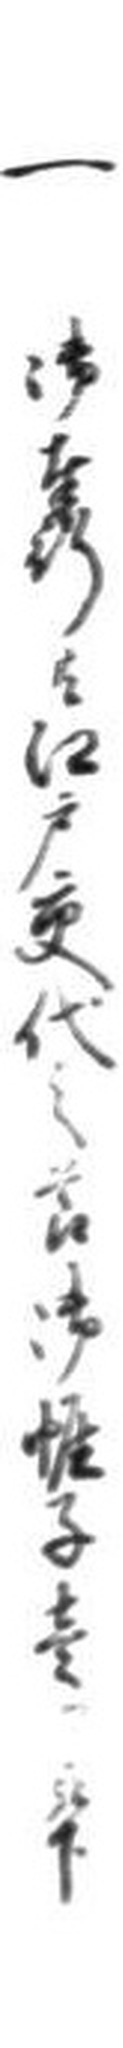一御奉行共江戸交代之節御帷子壱被下
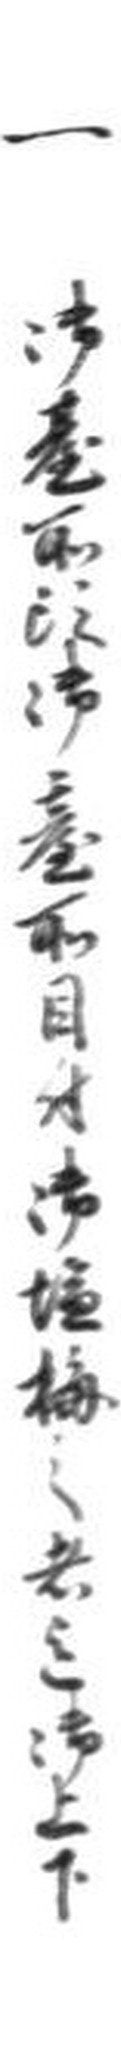一御台所頭御台所目付御塩梅之者迄御上下

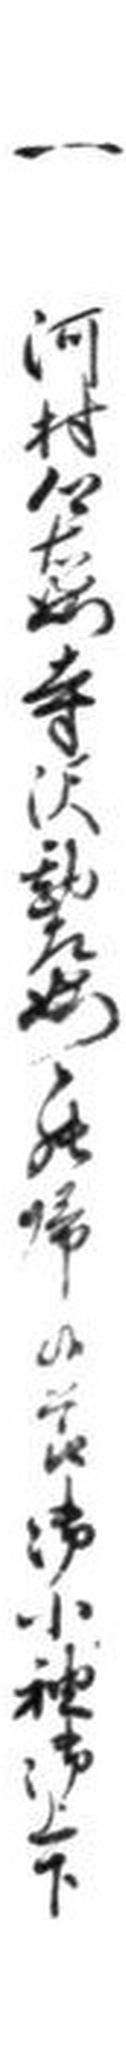一河村郷右衛門寺沢勘左衛門罷帰候節御小袖御上下
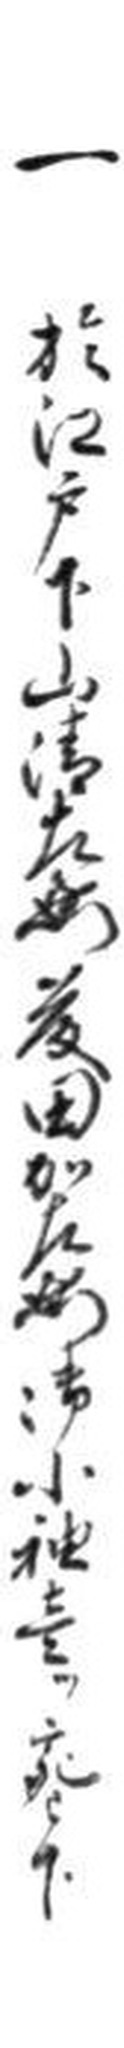一於江戸下山清左衛門藤田加左衛門御小袖壱ツ宛被下
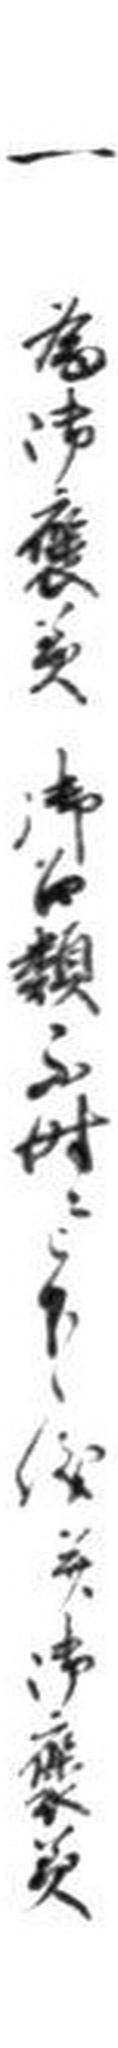一為御褒美御召類不時ニ被下候儀并御褒美
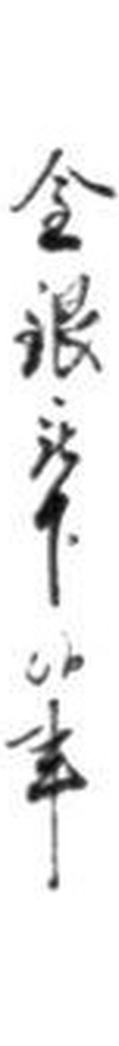金銀被下候事
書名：家譜 三十六 宗昌公 従享保八年到同九年
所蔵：福井県文書館 Fukui Prefectural Archives
